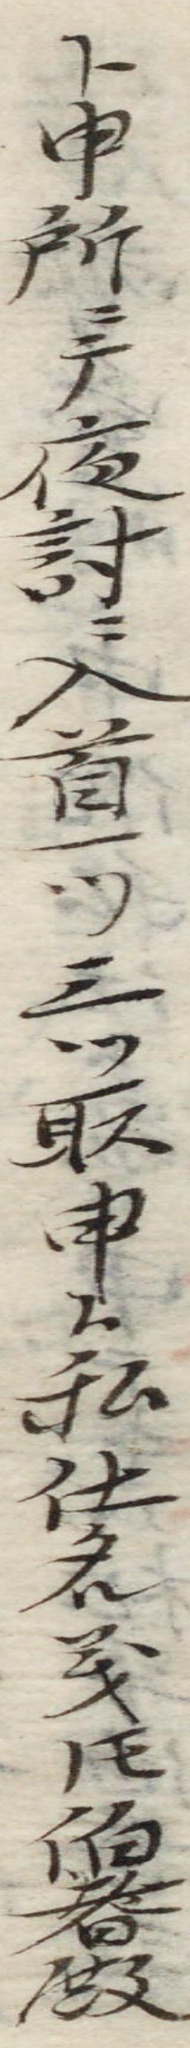ト申所ニテ夜討ニ入首一ツ三ツ取申候私仕名義トモ伯耆殿
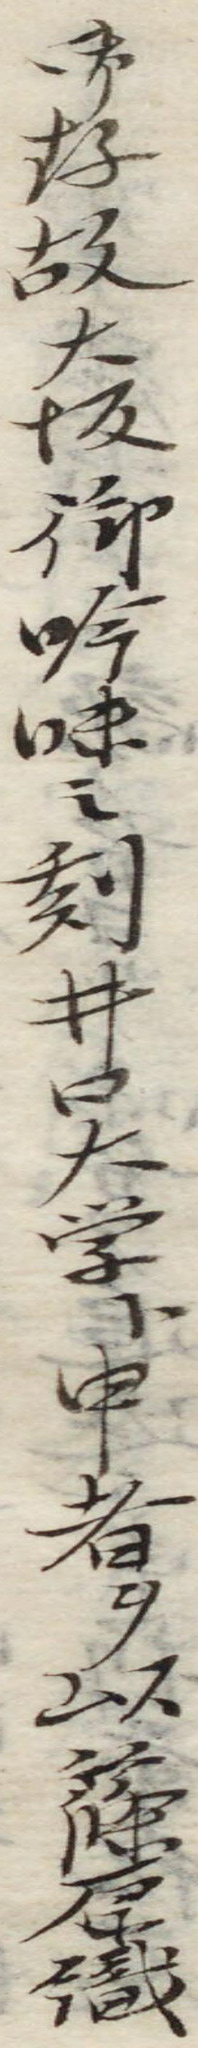御存故大坂仰吟味之刻井口大学ト申者ヲ以篠葉織
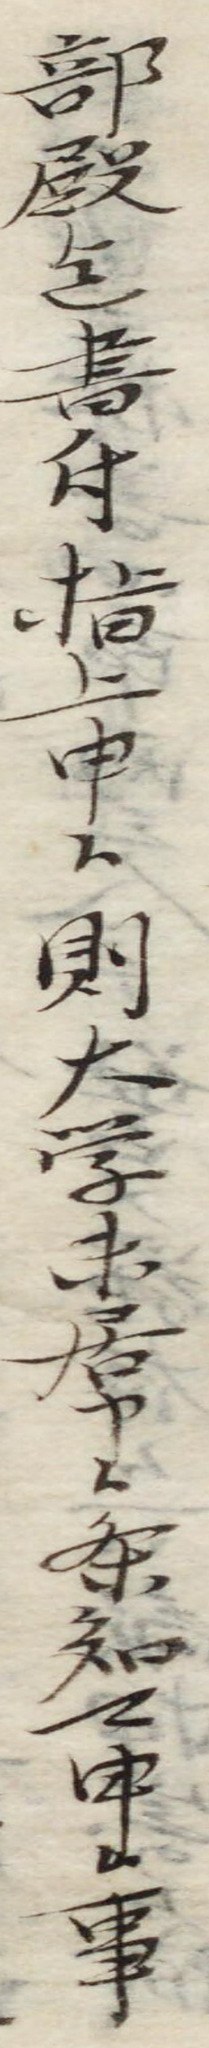部殿迄書付指上申候則大学未居申候条知可申候事
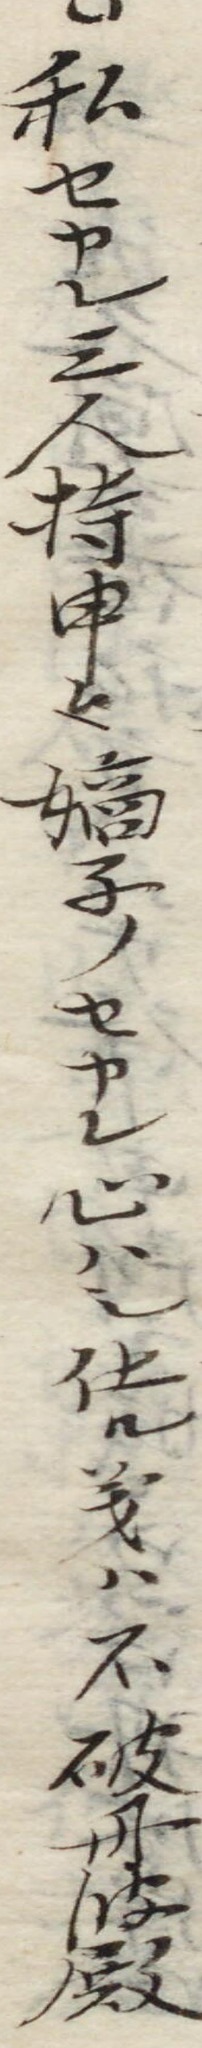〇私セカレ三人持申候嫡子ノセカレ心ハシ仕ル義ハ不破丹波殿
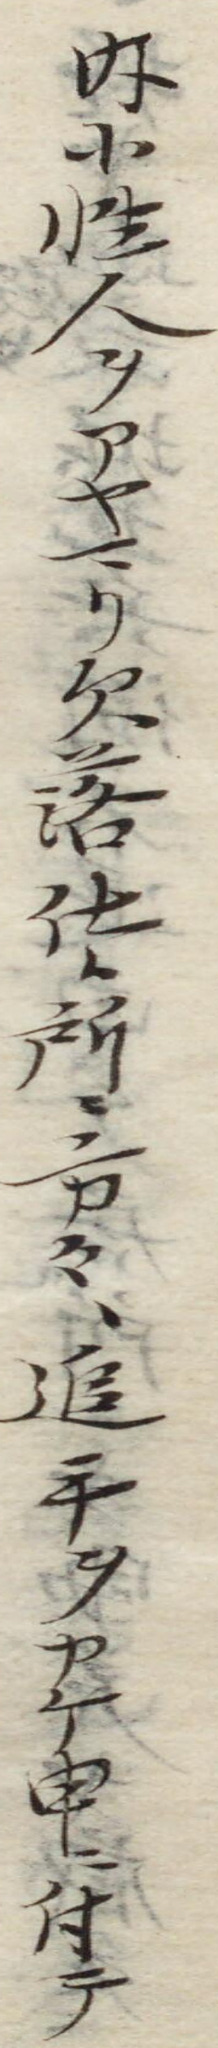内小姓人タアヤマリ欠落仕候処ニ方々追手ヲカケ申ニ付テ
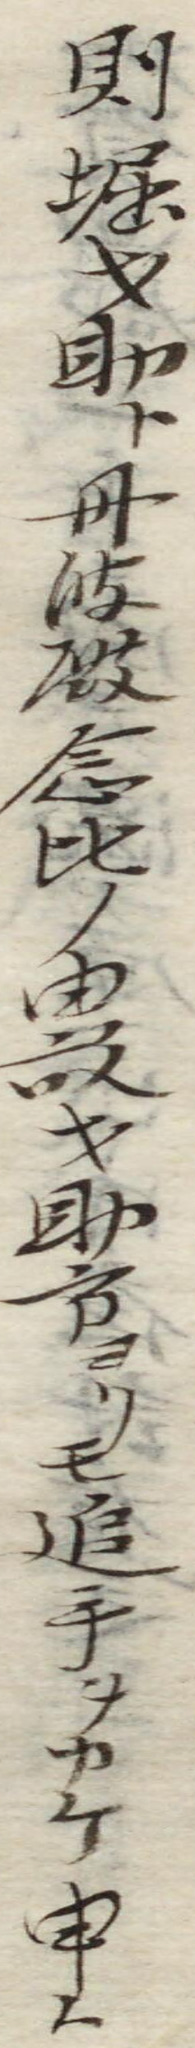則堀才助ト丹波殿念比ノ由故才助方ヨリモ追手ヲカケ申候
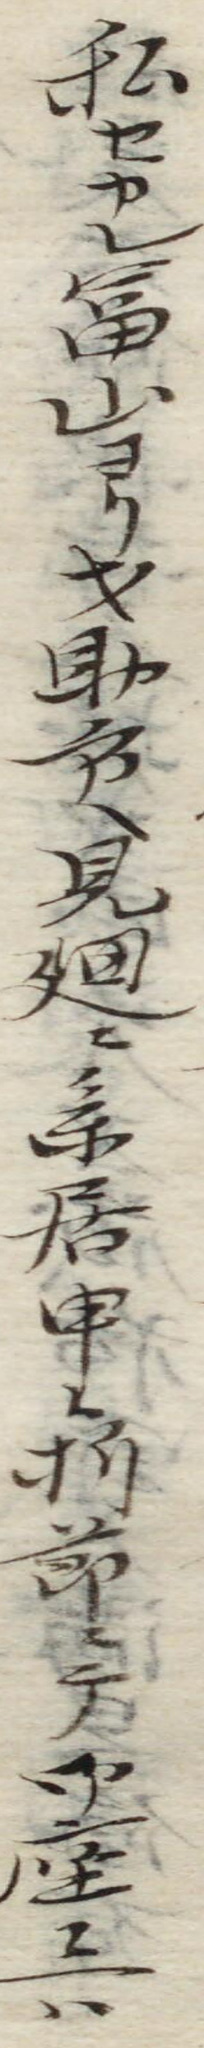私セカレ冨山ヨリ才助方へ見廻ニ参居申候折節二テ御座候へハ
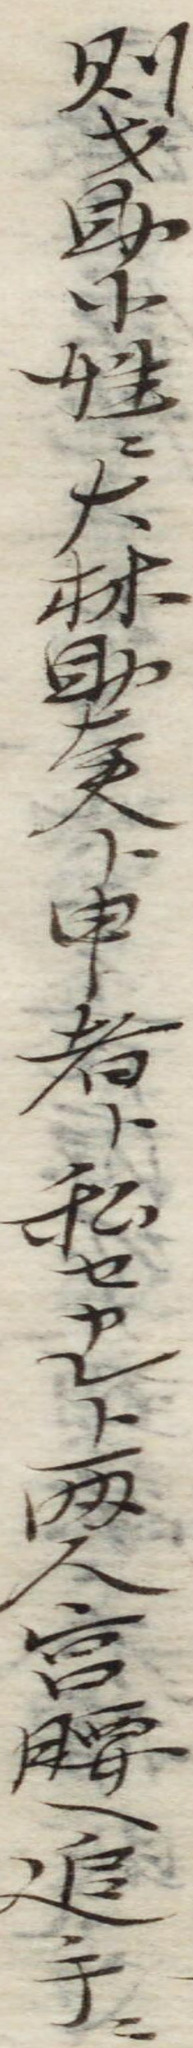則才助小姓ニ大林助太夫ト申者ト私セカレ両人宮腰へ追手ニ
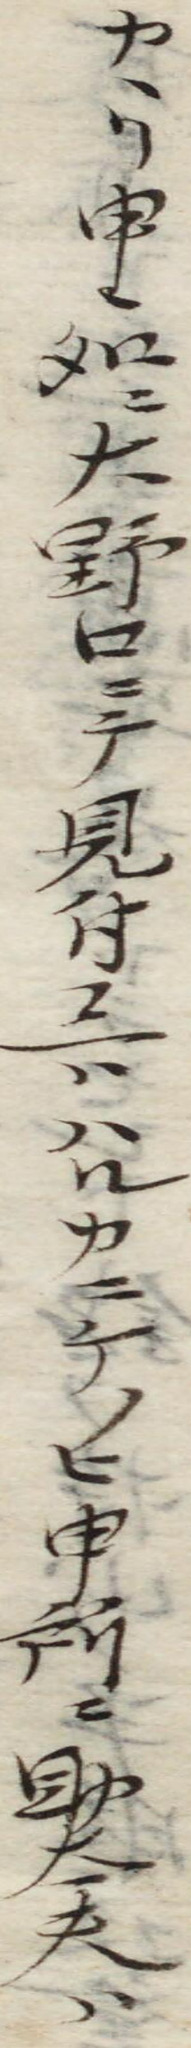カヽリ申候処ニ大野口二テ見付候へハハルカニケノヒ申所ニ助太夫ハ
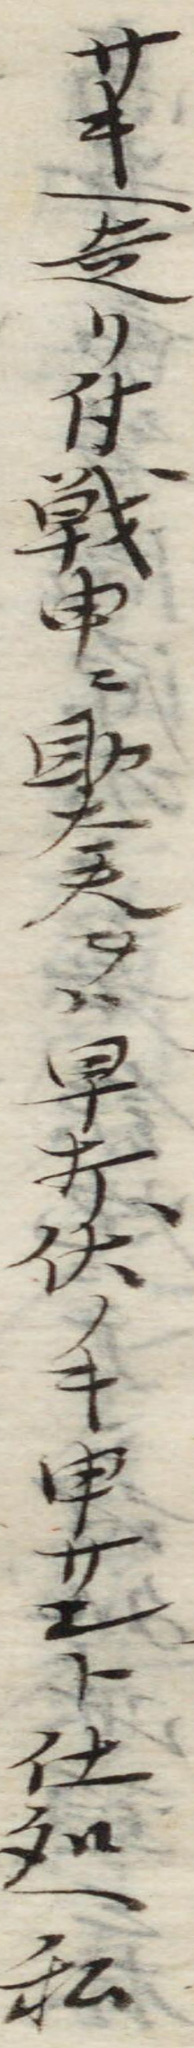サキへ走リ付戦申ニ助太夫ヲハ早折伏ノキ申サント仕処へ私
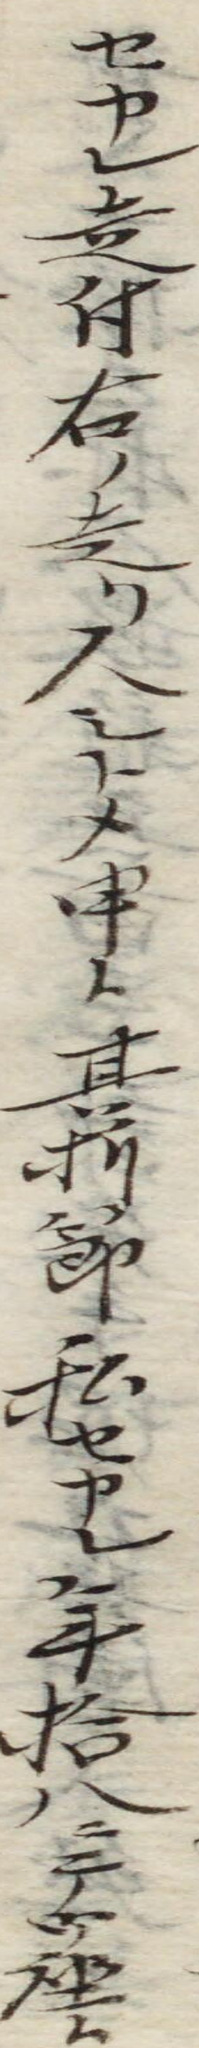セカレ走付右ノ走り人シトメ申候其折節私セカレ年拾八二テ御座候
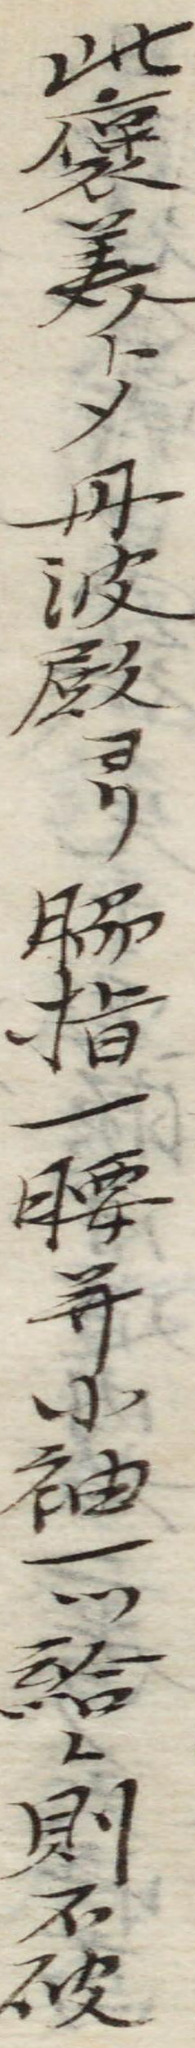此褒美トメ丹波殿ヨリ脇指一腰并小袖一ツ給候則不破
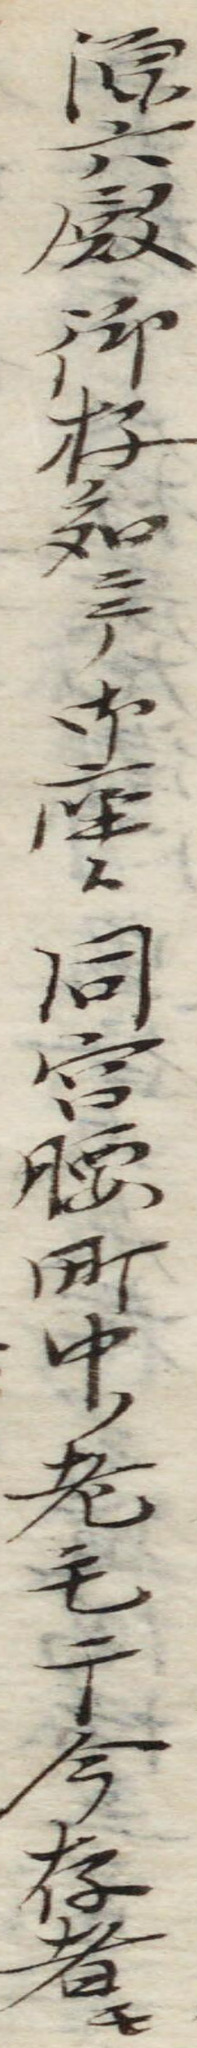源六殿御存知ニテ御座候同宮越町中ノ老毛于今存者モ
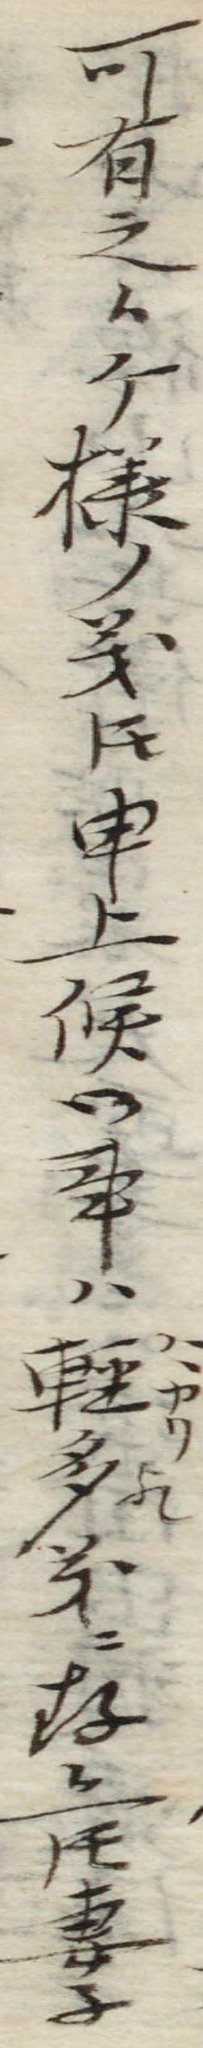可有之候ケ様ノ義トモ申上候御事ハ輕多義ニ存候ヘトモ妻子
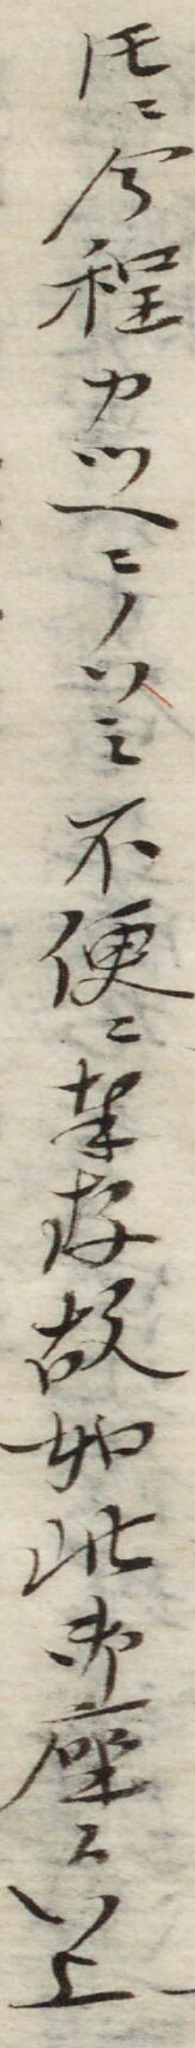トモニ今程カツヘニノソ之不便ニ奉存故此御座候以上
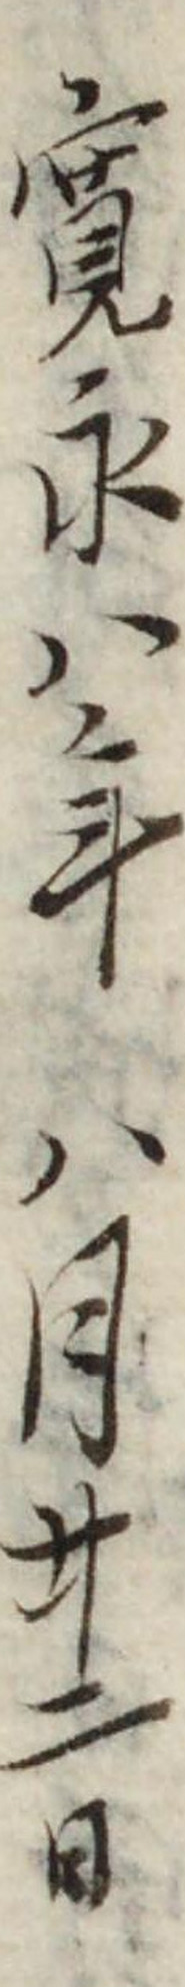寛永八年八月廿二日
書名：聞見雑録
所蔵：Ishikawa Prefectural Library
